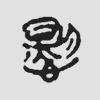惻
